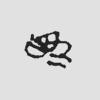爲
